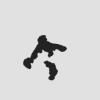虫
